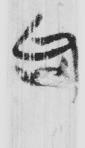句
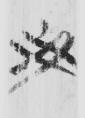我
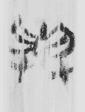與
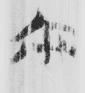尔
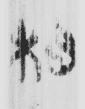相
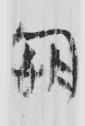念
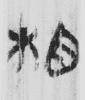相
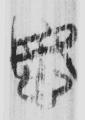悔
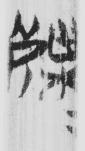殜=
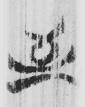至
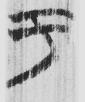于
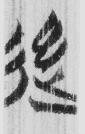後
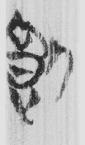飤
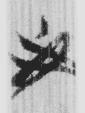我
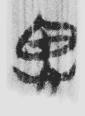思
